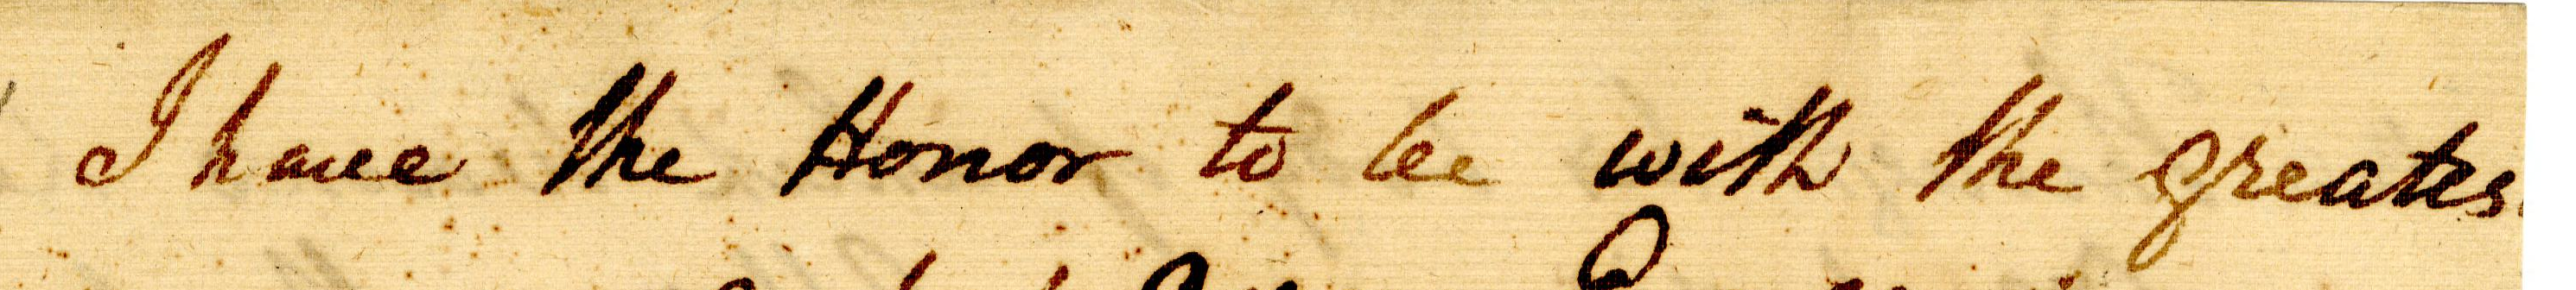I have the Honor to be with the greates
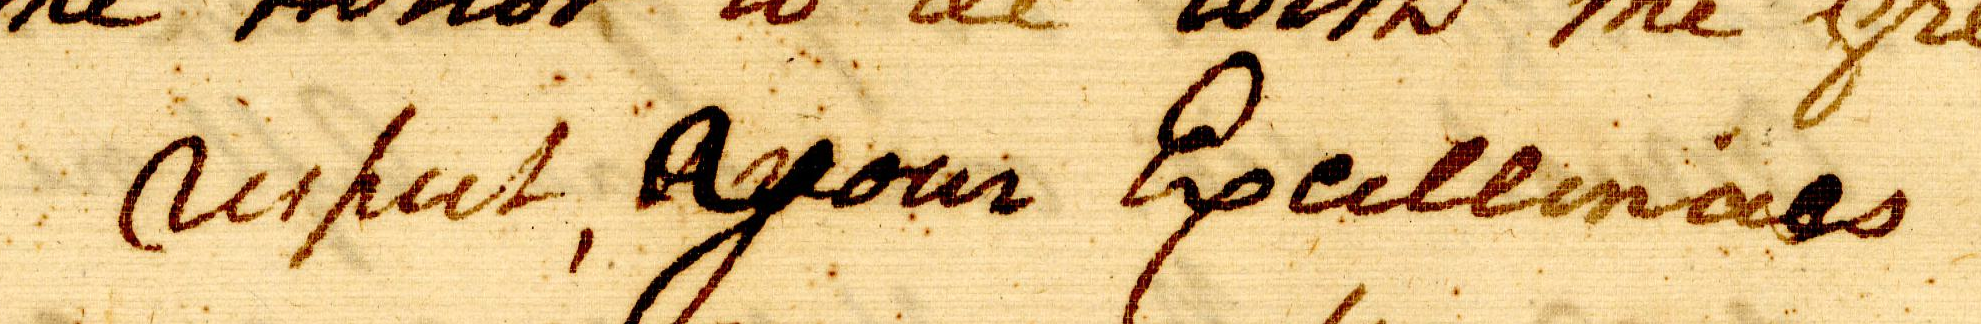respect, your Excellencies
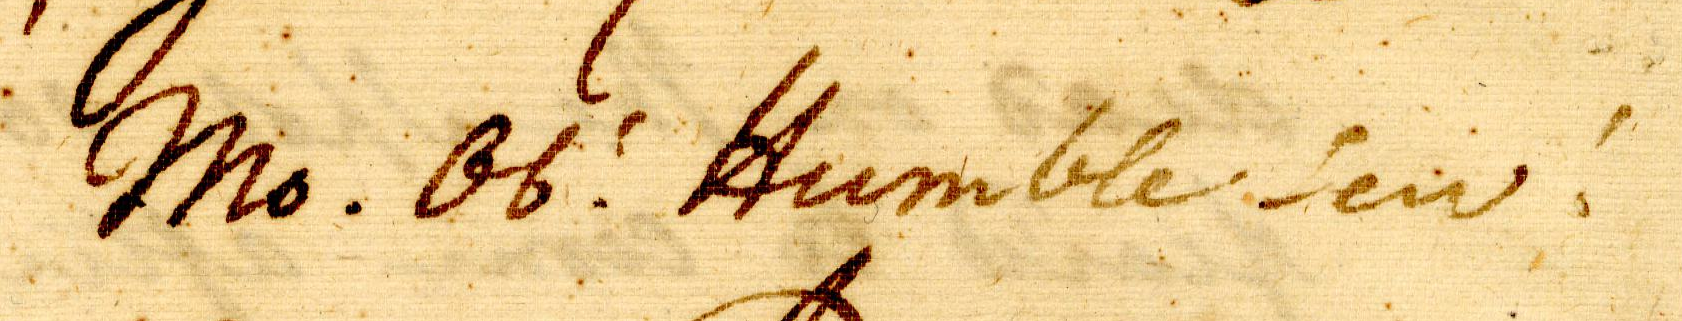Mo. Ob^t. Humble Serv^t
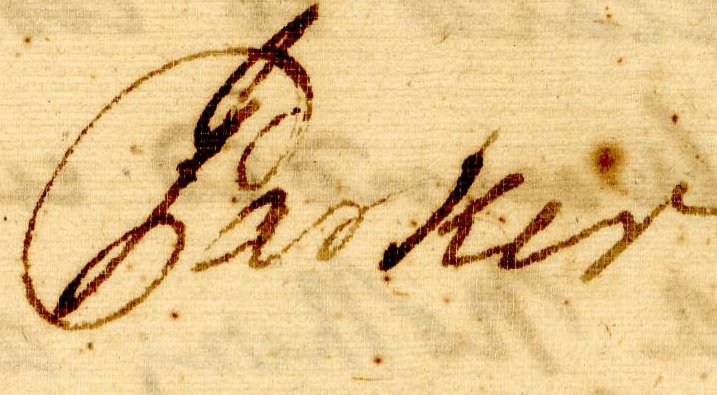Parker
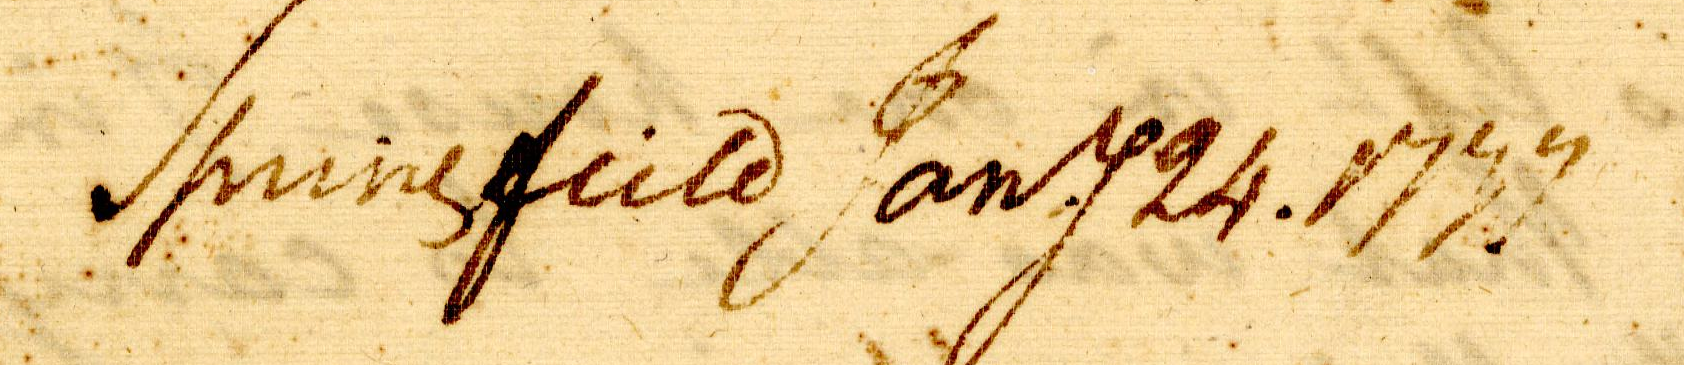Springfield Jan^y. 24. 1777
